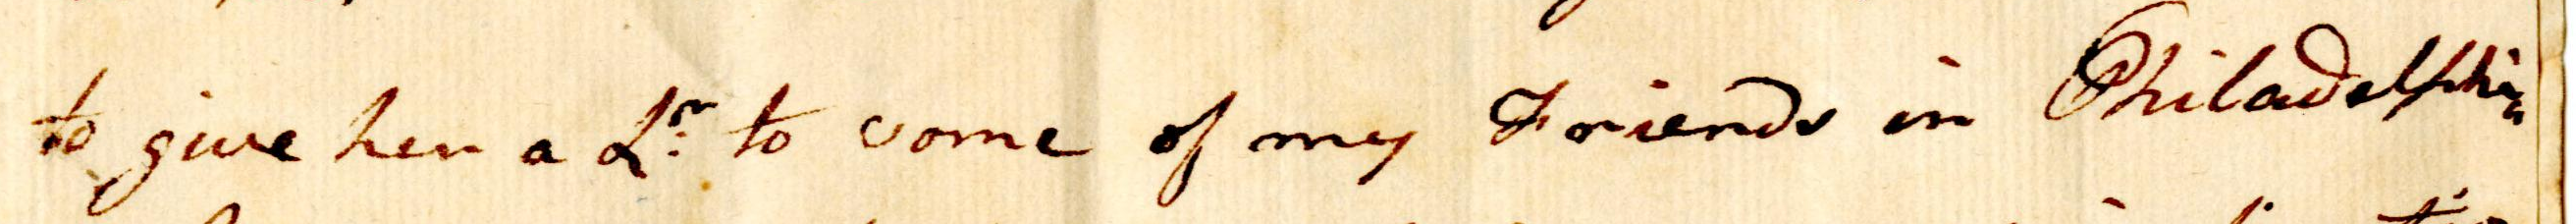to give her a L^r. to some of my Friends in Philadelphia
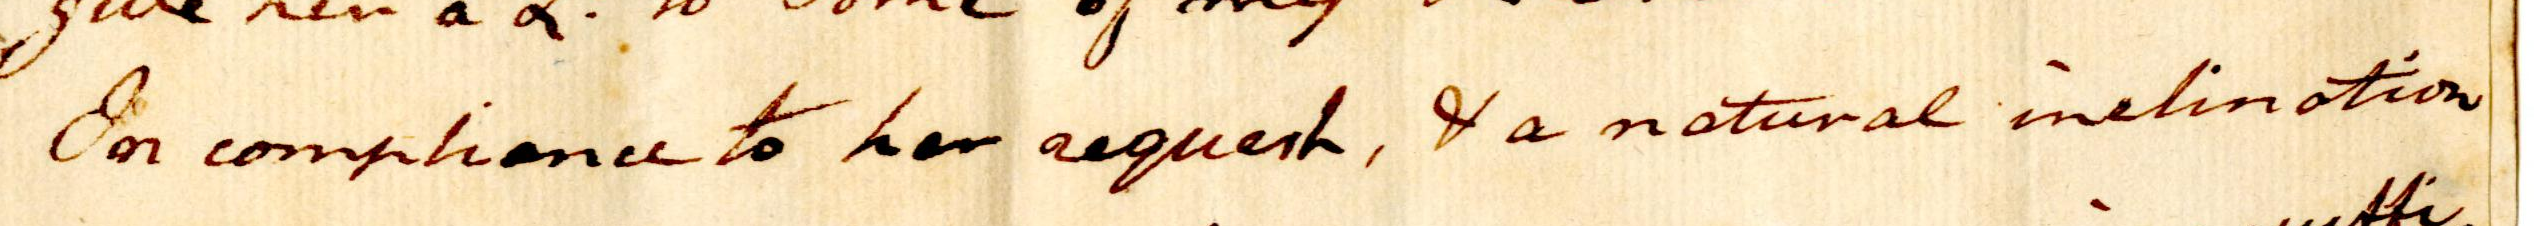In compliance to her request, & a natural inclination
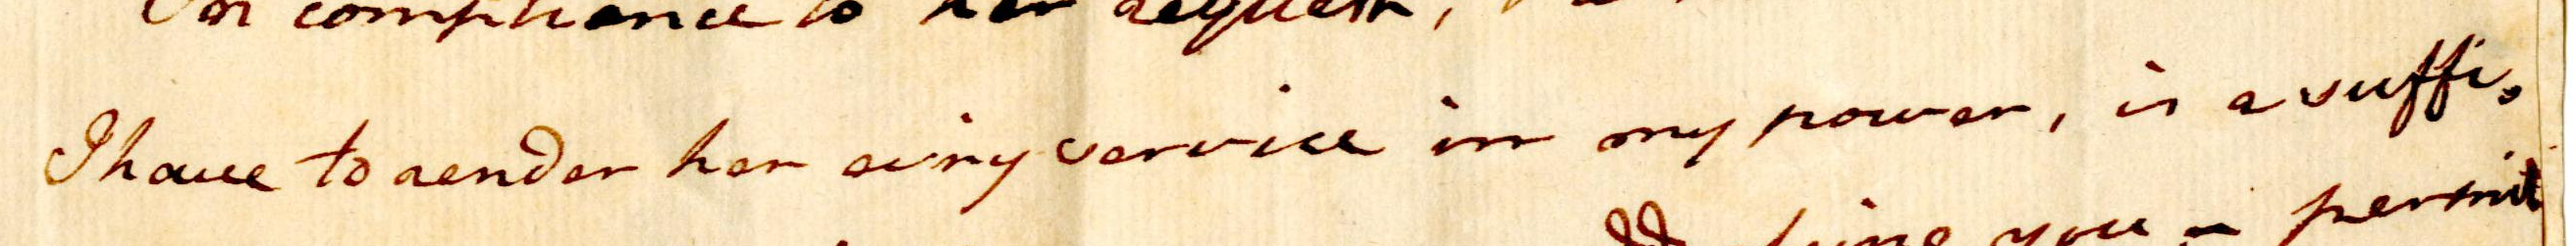I have to render her own service in my power, is a suff-
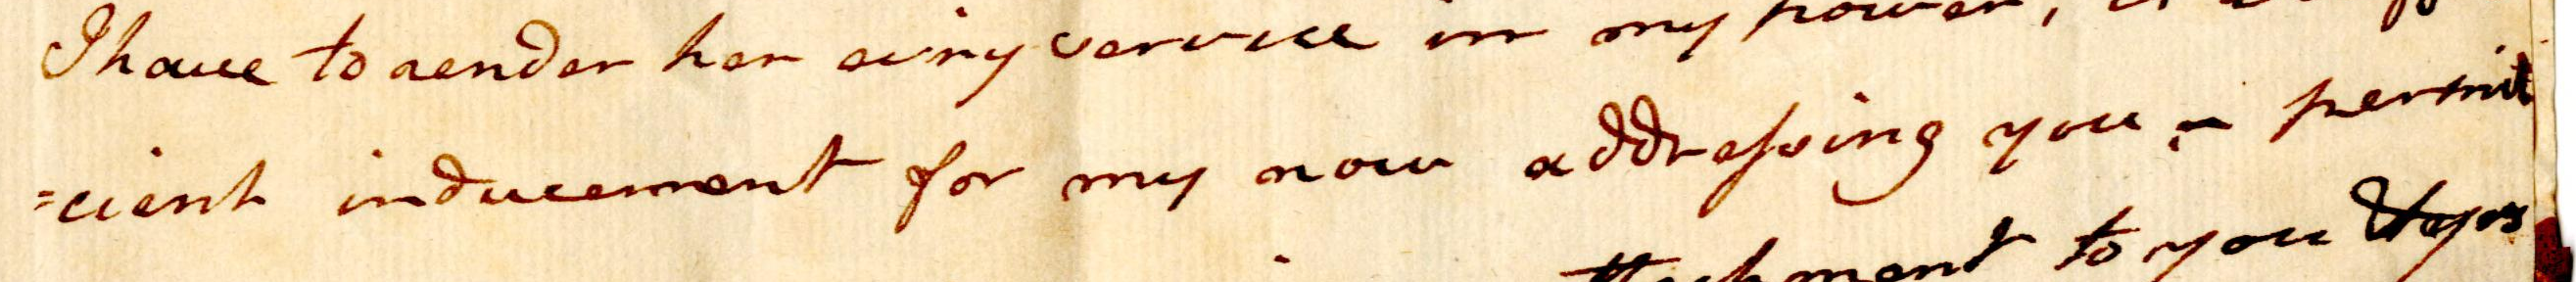-cient inducement for my now addressing you.- permits
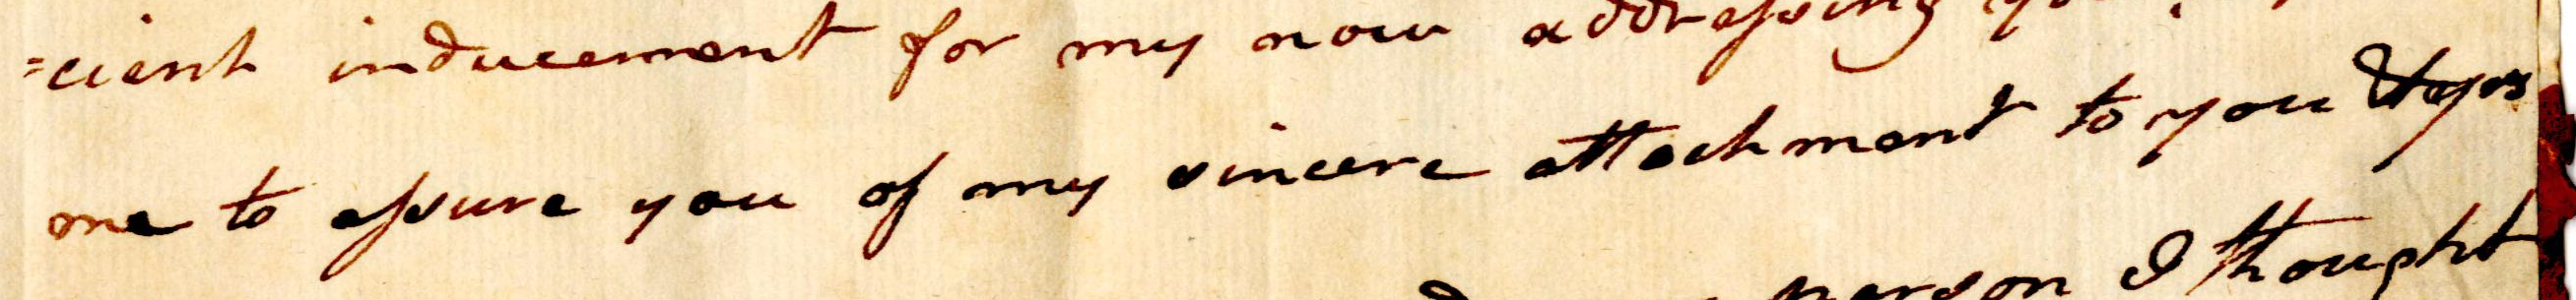one to assure you of my sincere attachment to you & your
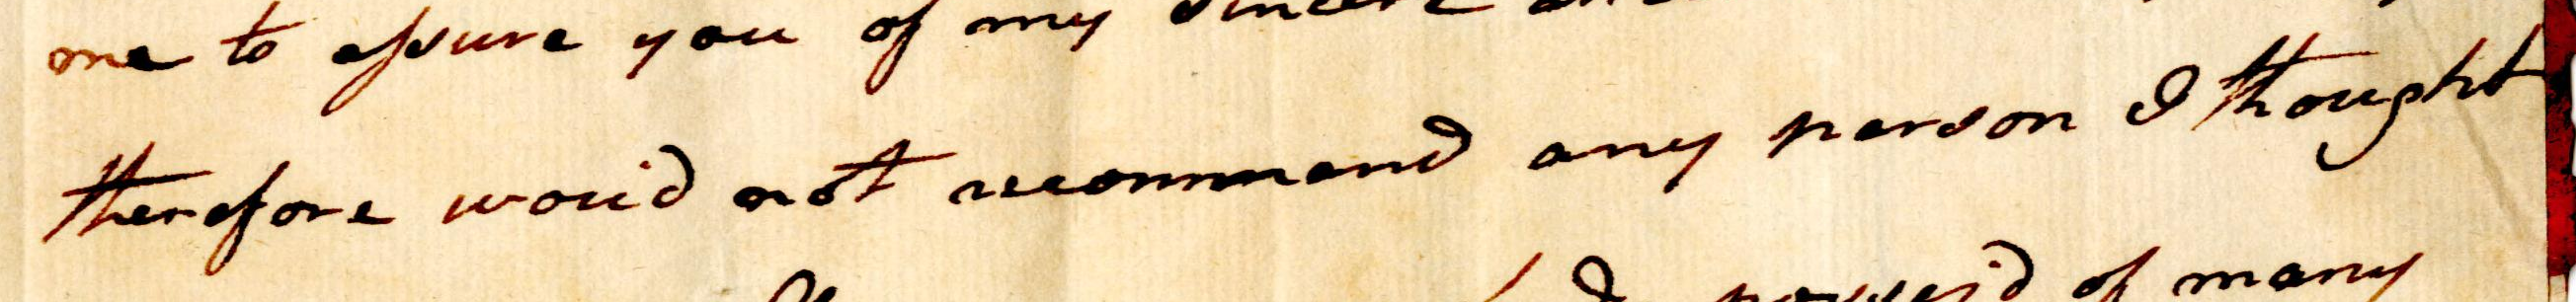therefore wou'd not recommend any person I thought
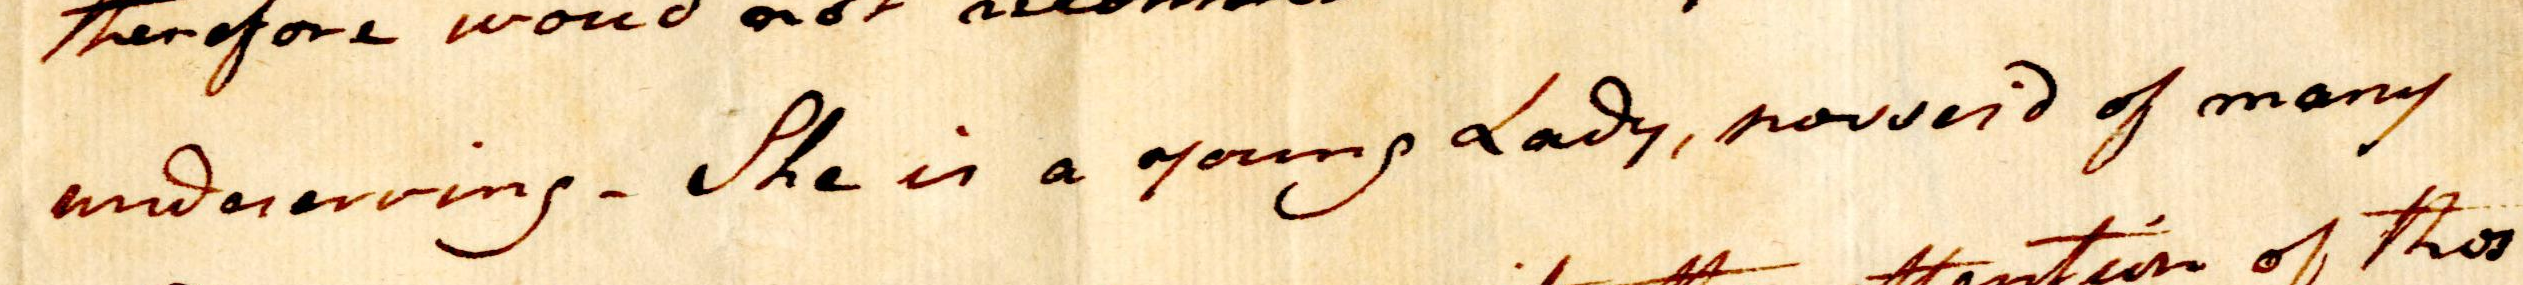undeserving- She is a young Lady, reserv'd of many
